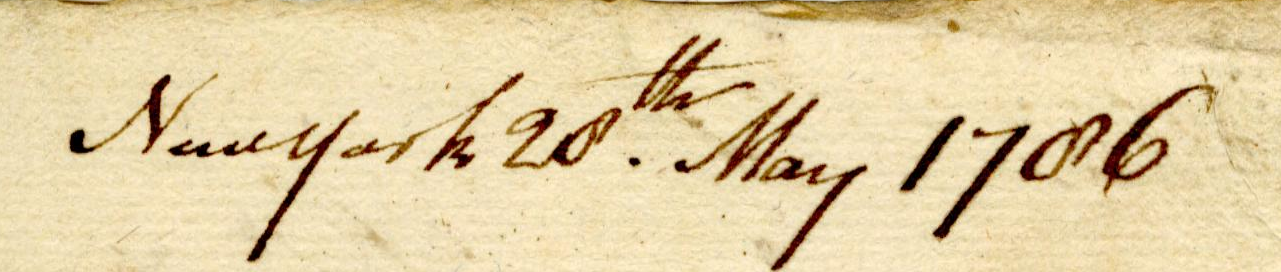New York 20^th May 1786
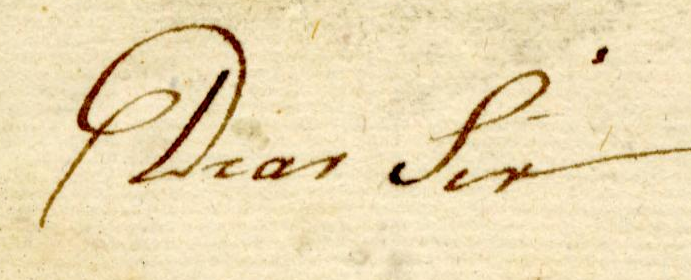Dear Sir
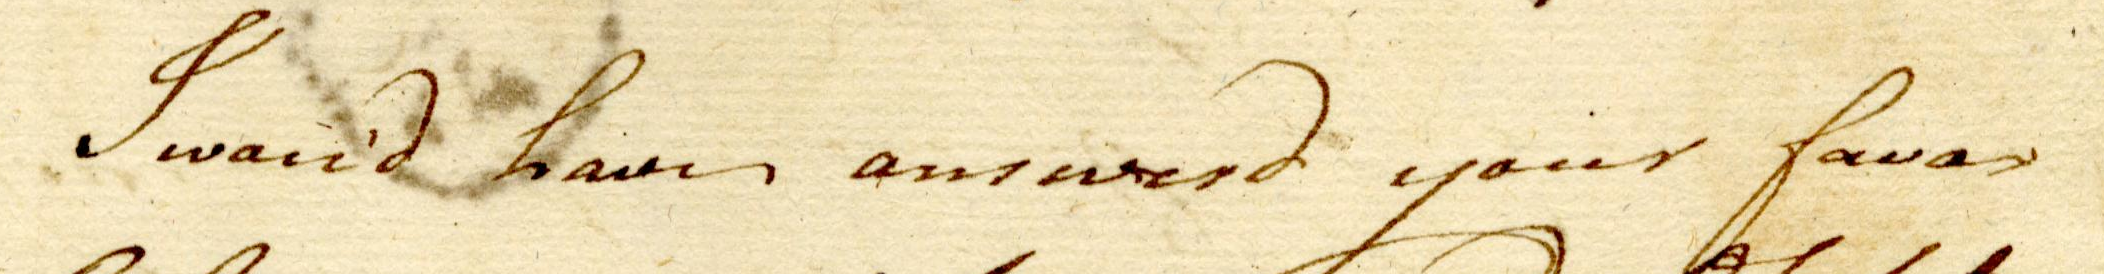I wau'd have answerd your favor
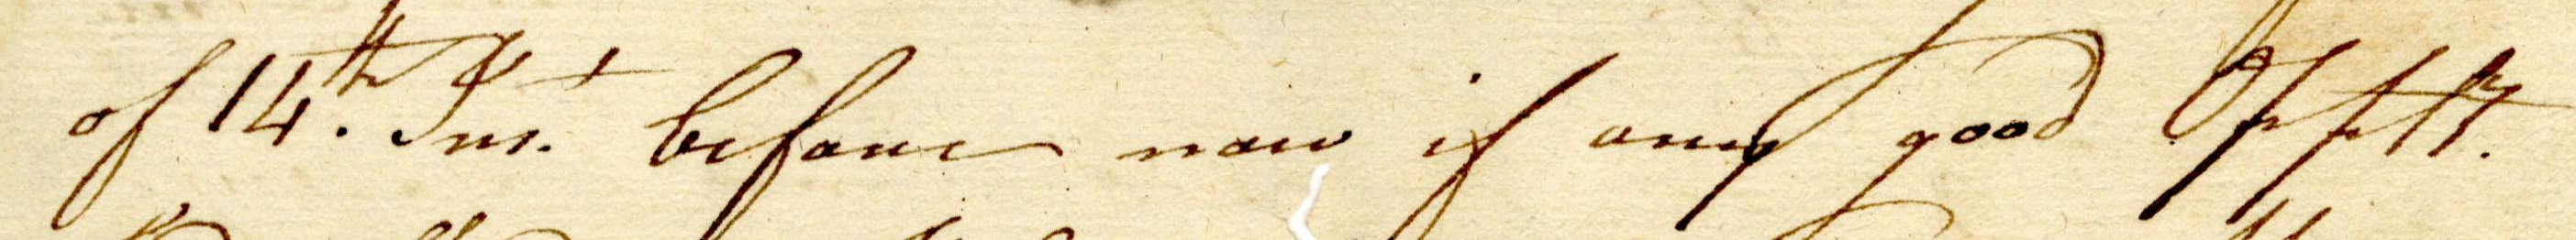of 14^th. Ins^t. before now if any good Oppt^y
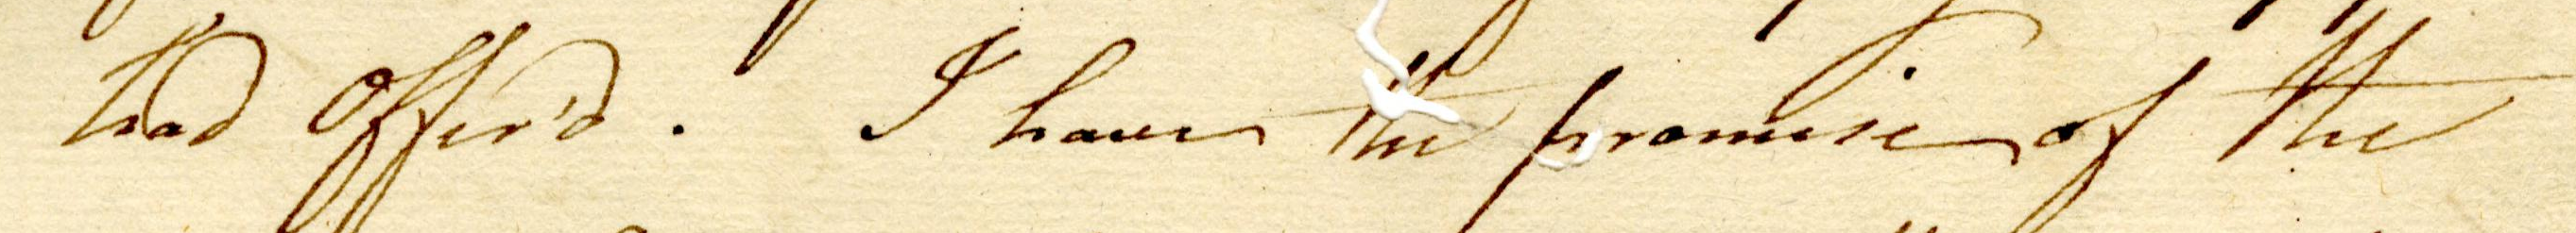had Offer'd. I have the promise of the
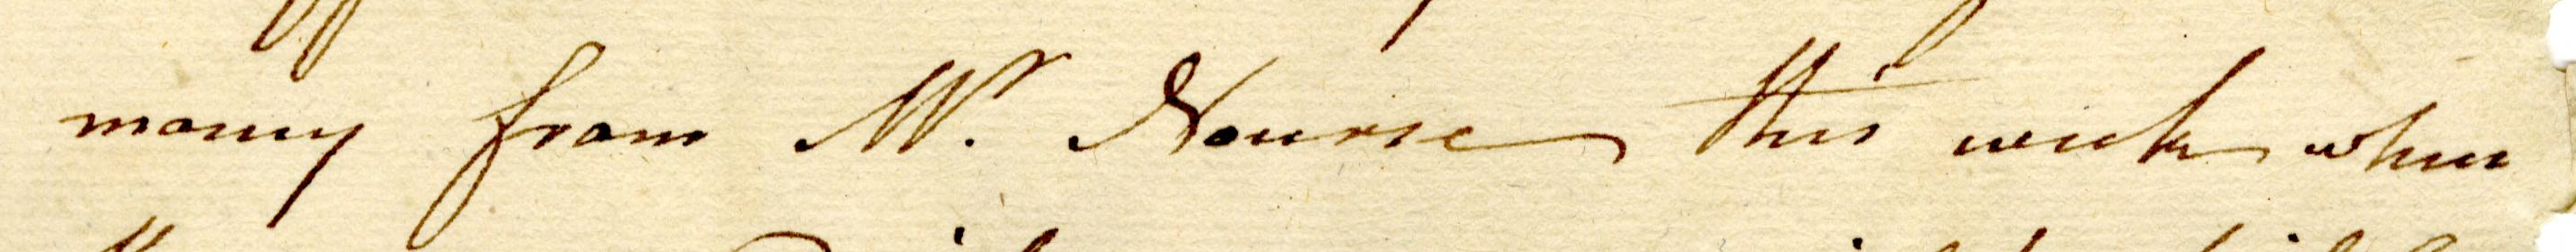money from M^r. Nourse this week where
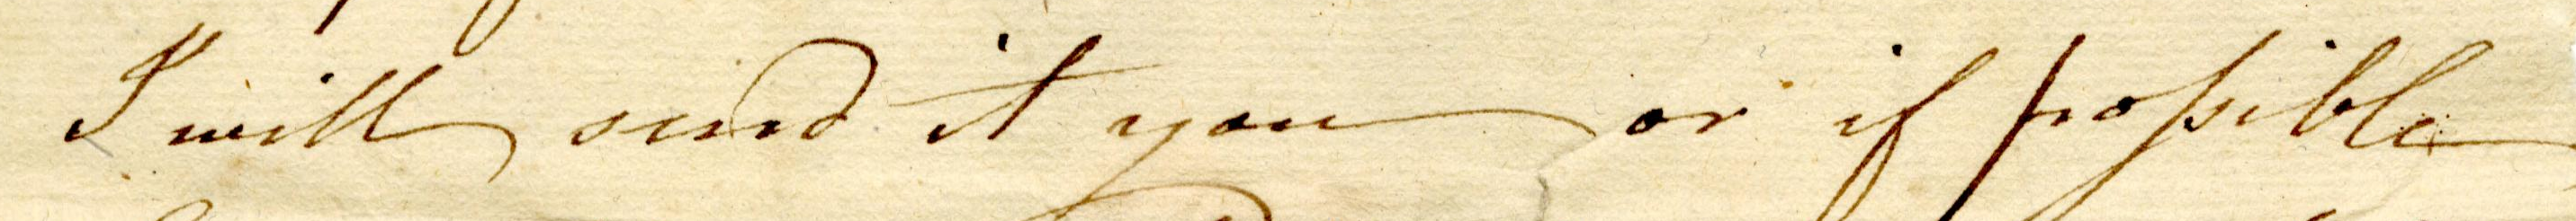I will send it you or if possible
